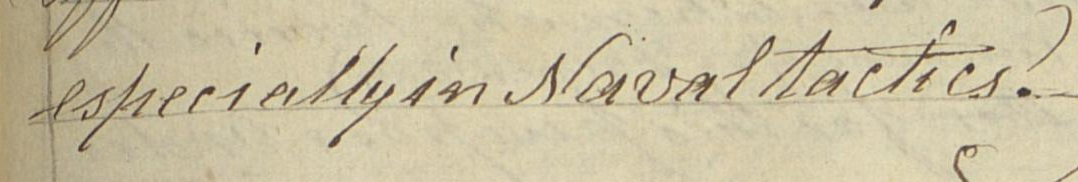especially in Naval tactics.
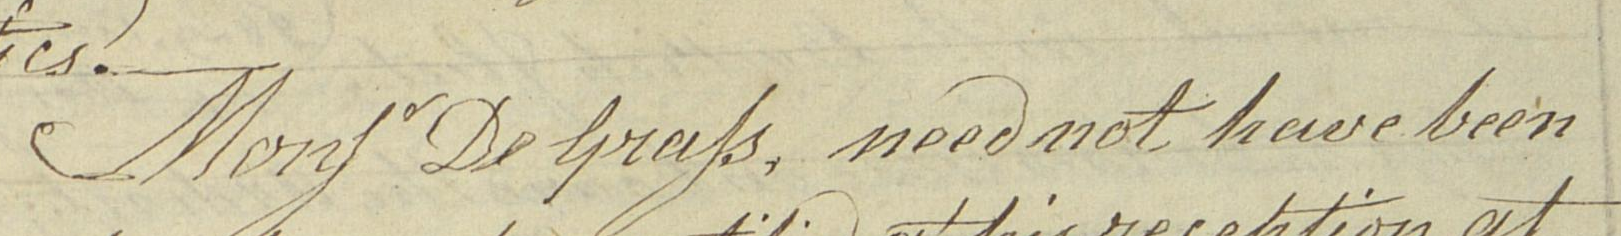Mons^r De Grass, need not have been
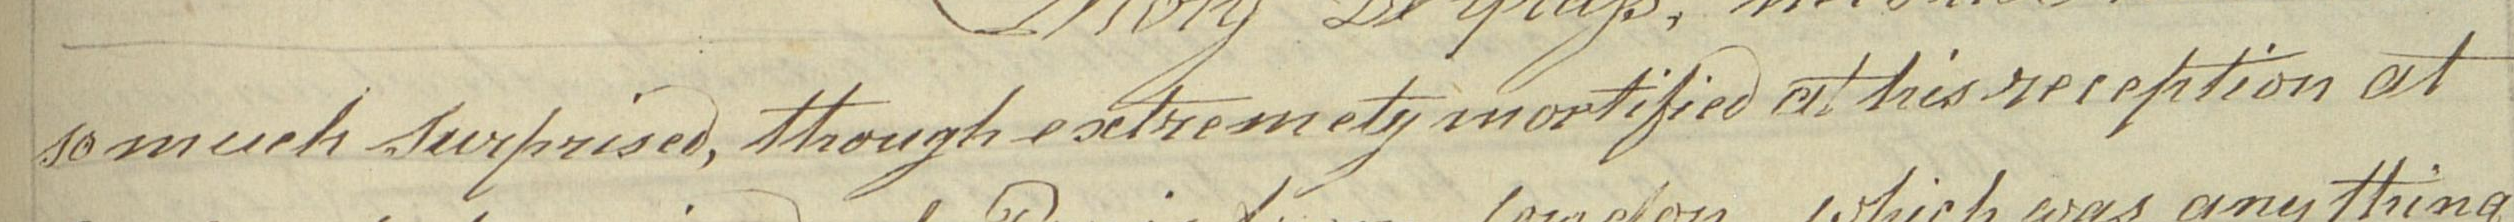so much surprised, though extremety mortified at his reception at
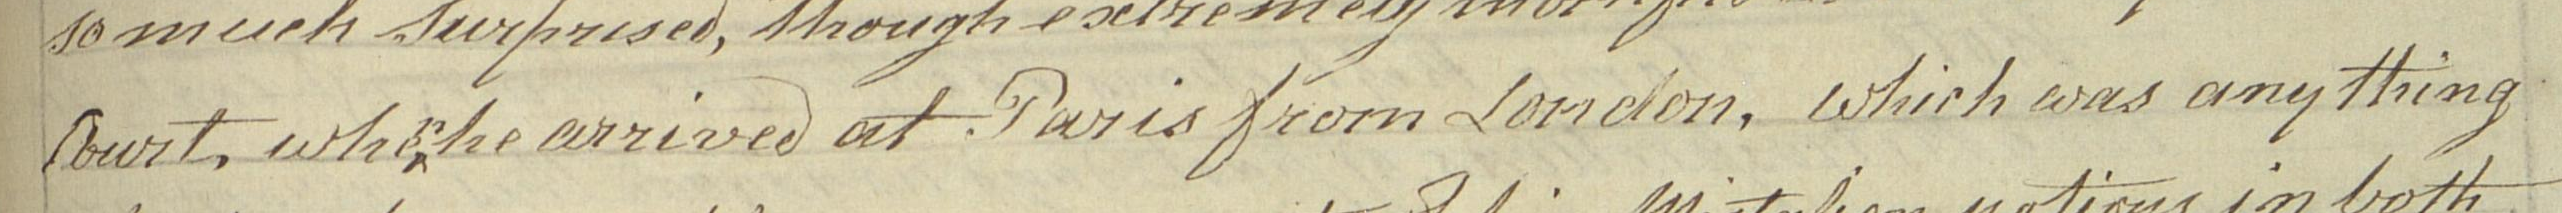Court, whe^n he arrived at Paris from London, which was anything
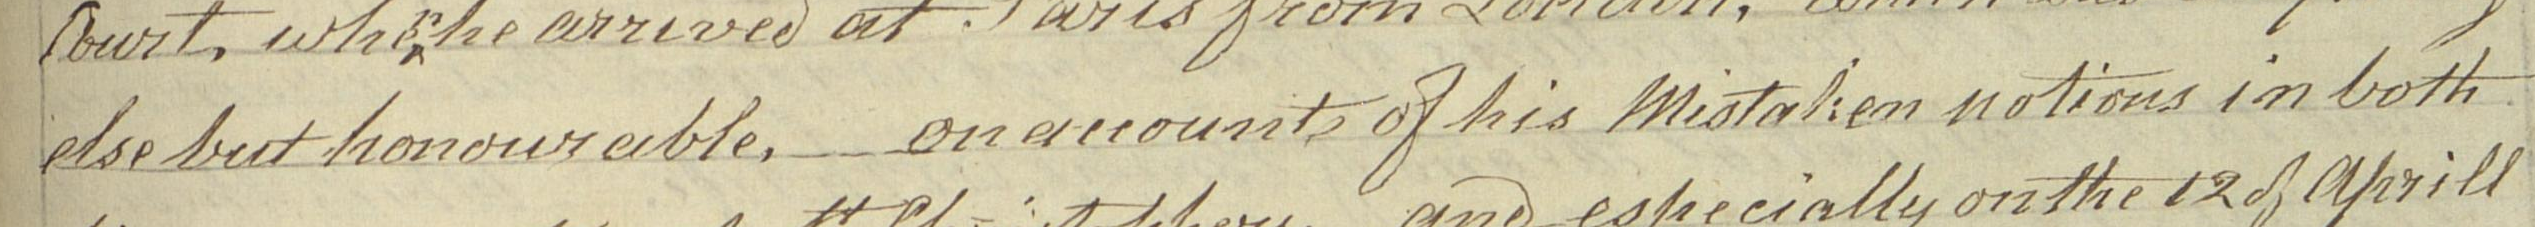else but honourable, on account of his Mistaken notions in both
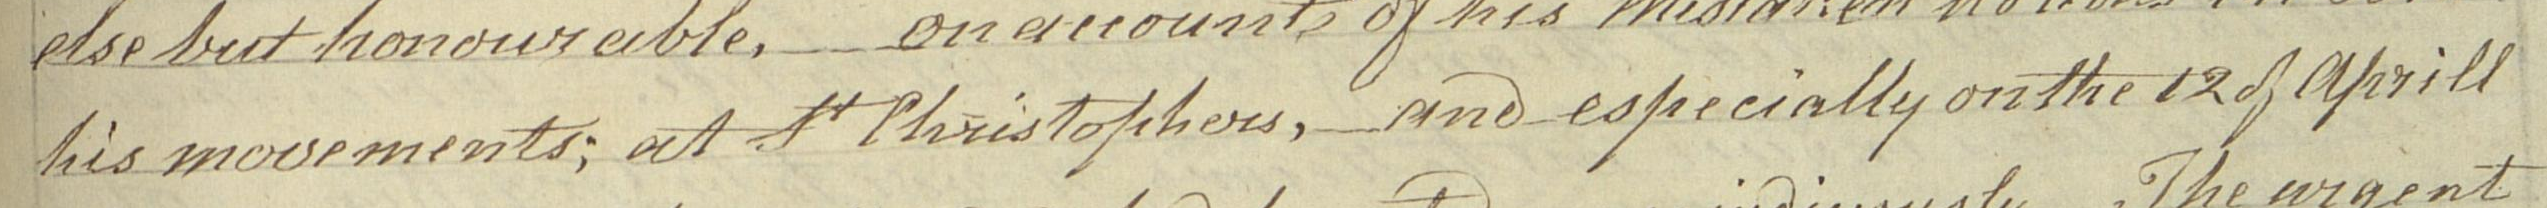his movements; at S^t Christophers, and especially on the 12 of Aprill
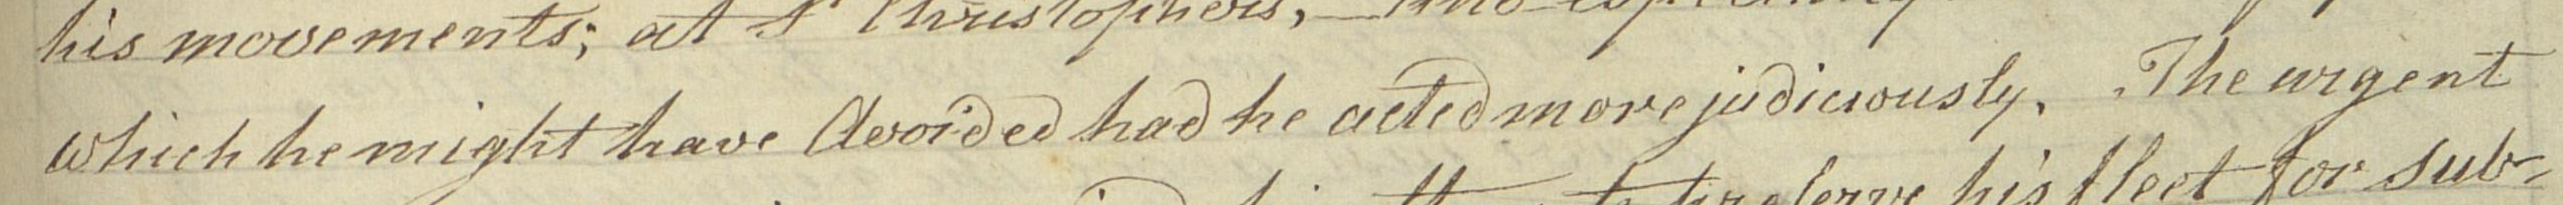which he might have Avoided had he acted more judiciously, The urgent
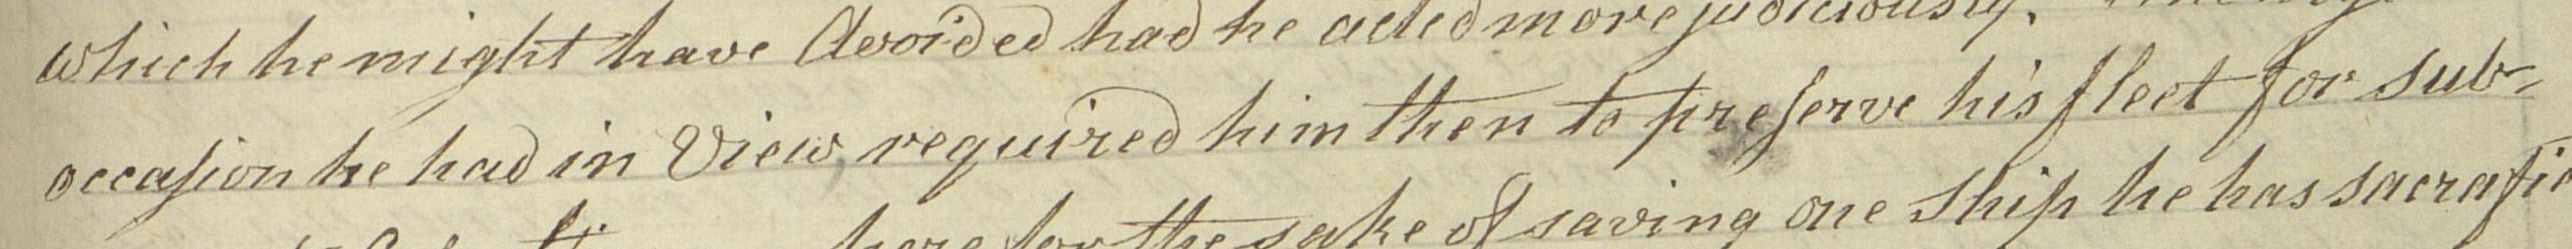occasion he had in view required him then to preserve his fleet for sub-
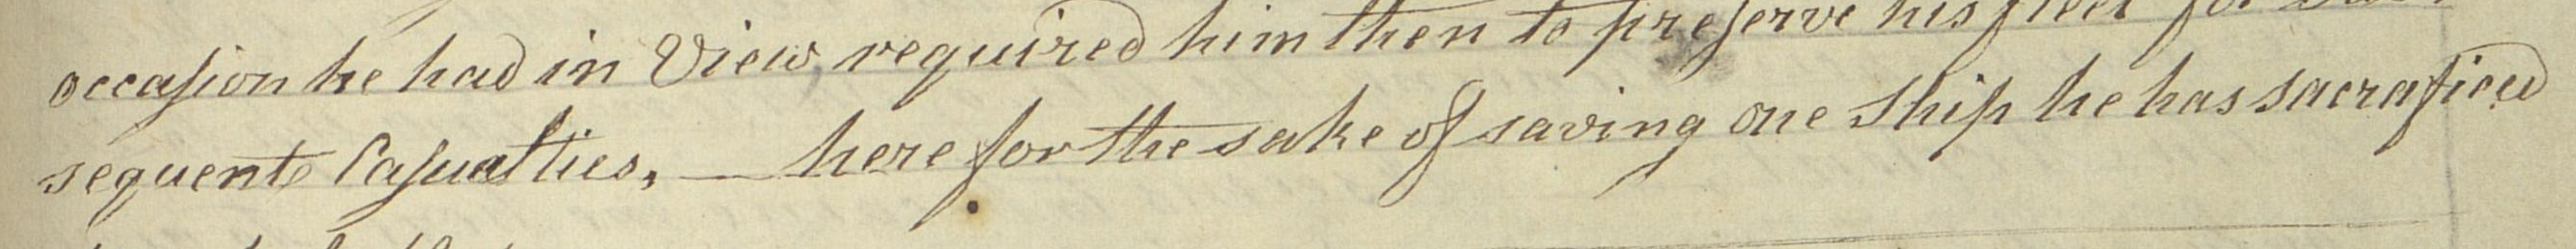-sequent Casualities, here for the wake of saving one ship he has sacraficed
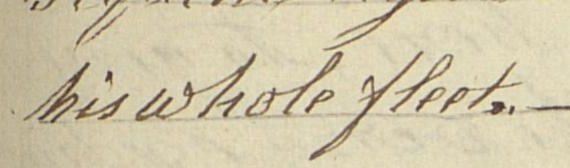his whole fleet.
